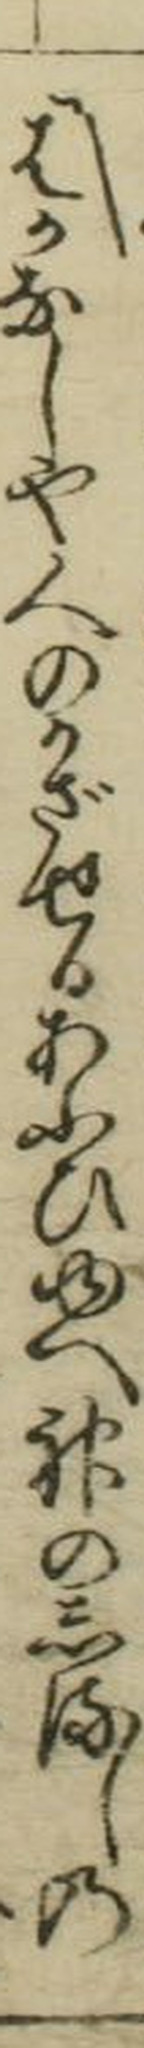〽はかなしや人のかざせるあふひゆへ神のしるしの
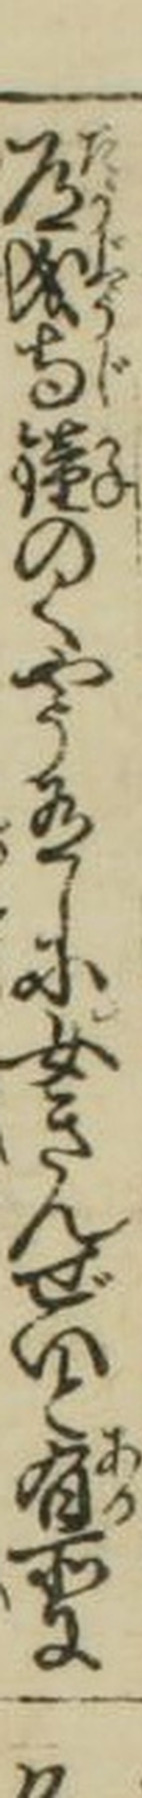道成寺鐘のくやう有しに。女きんぜいと有所に
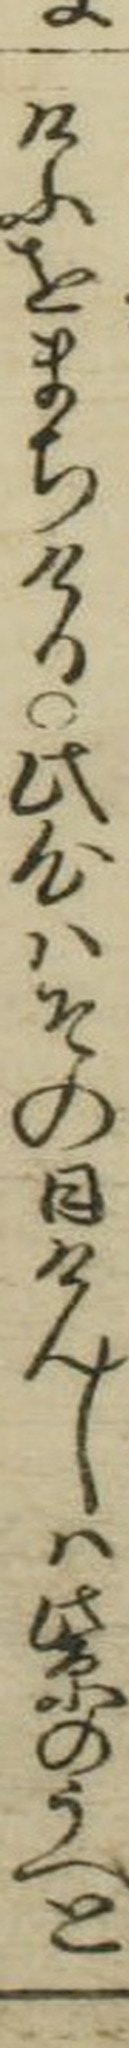けふをまちける○此心はその日けんしは紫のうへと
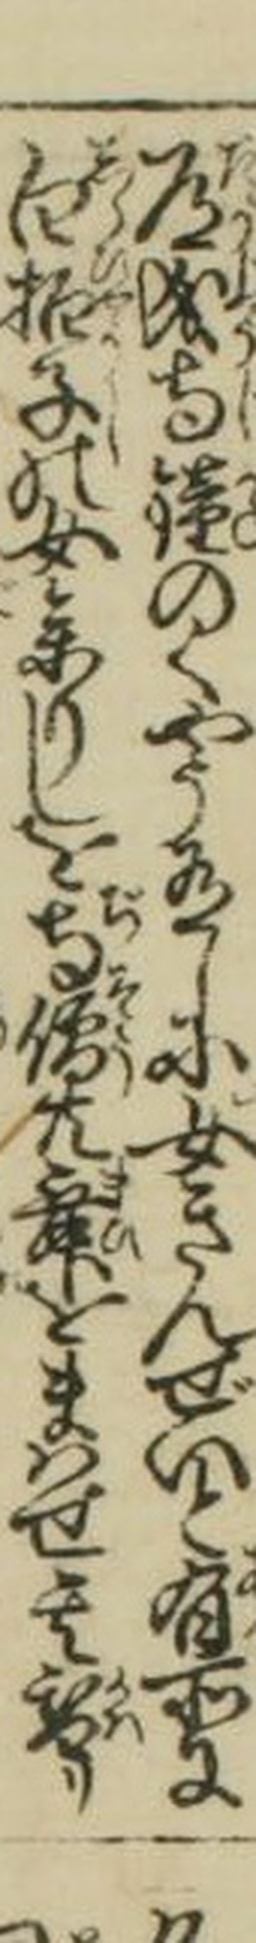白拍子の女参りしを寺僧共舞をまはせ其替り
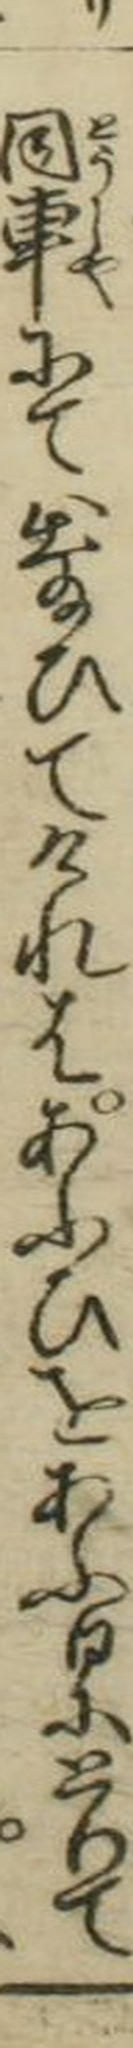同車にて出給ひてけれは。あふひをあふ日にとりて
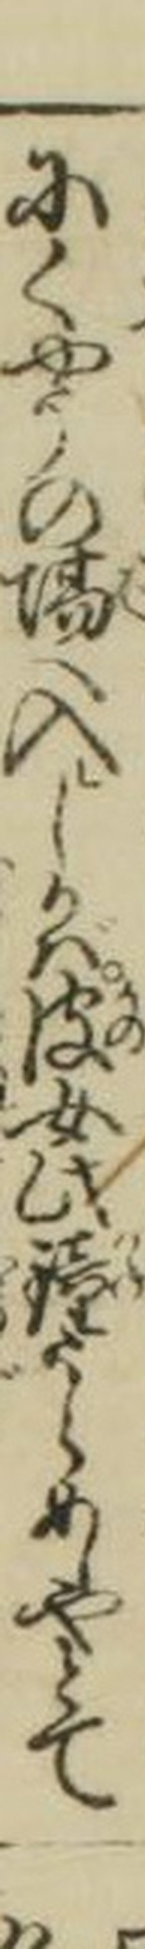にくやうの場へ入れしかば。彼女此鐘うらめしやとて
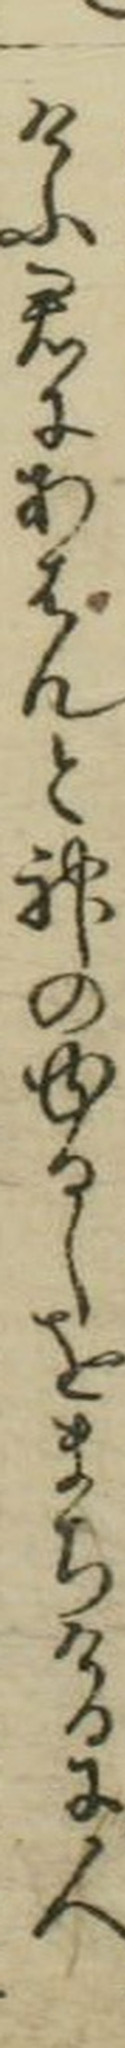けふ君にあはんと神のゆるしをまちけるに。人
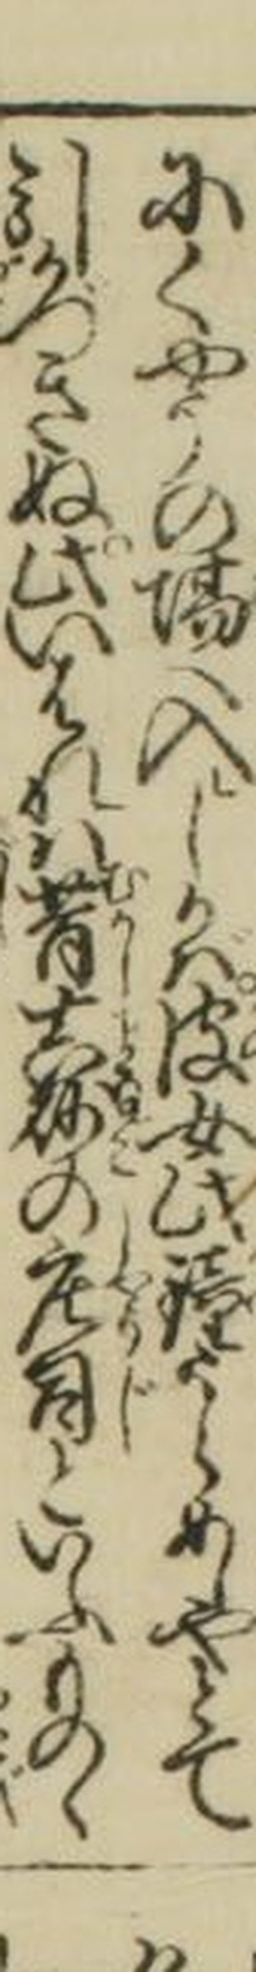引かづきぬ。此いはれは昔真砂の庄司といふものゝ
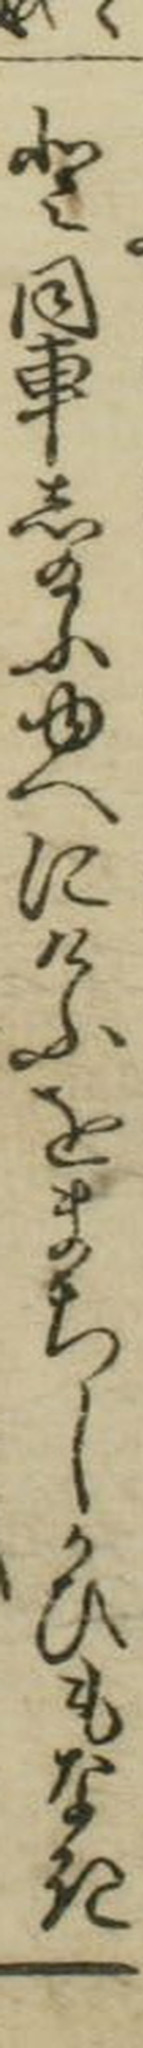と同車し給ふゆへにけふをまちしかひもなき
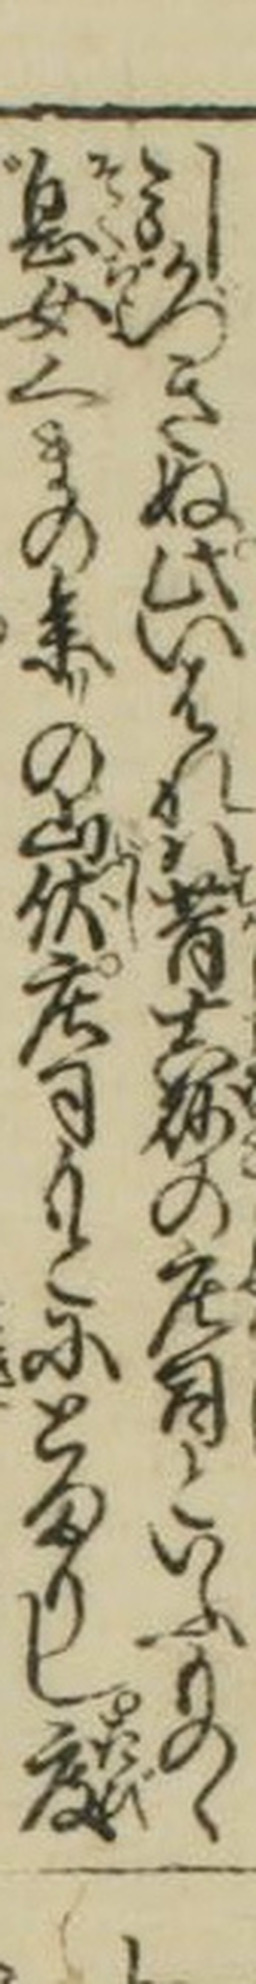息女くまの参りの山伏。庄司もとにとまりし。度
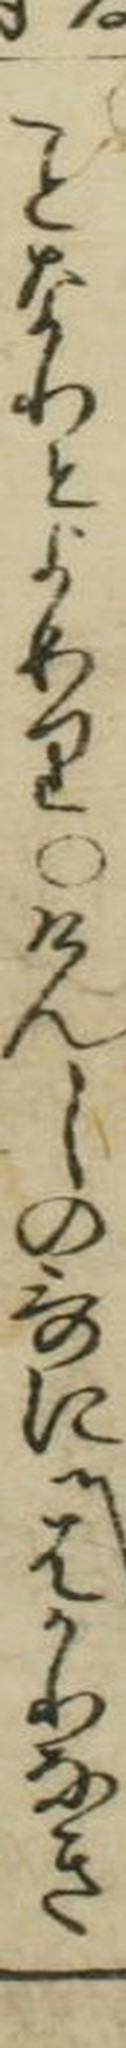ことなりとよめり○けんしの哥に〽はかりなき
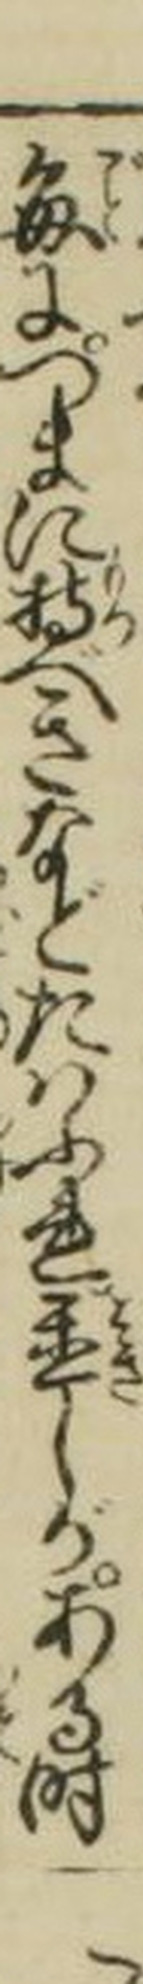毎に。つまに持べきなどたはふれ置しが。ある時
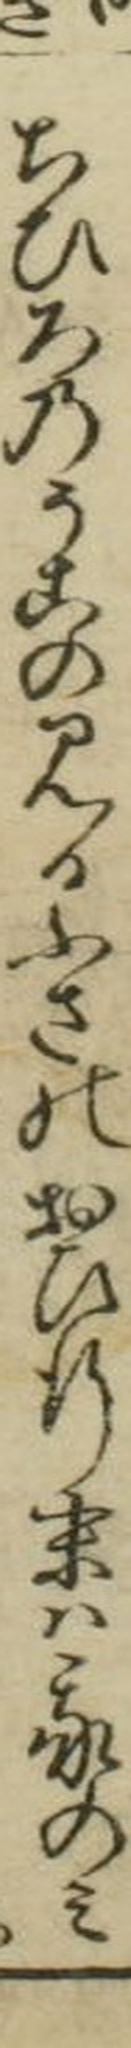ちひろのそこのみるふさのおひ行末は我のみ
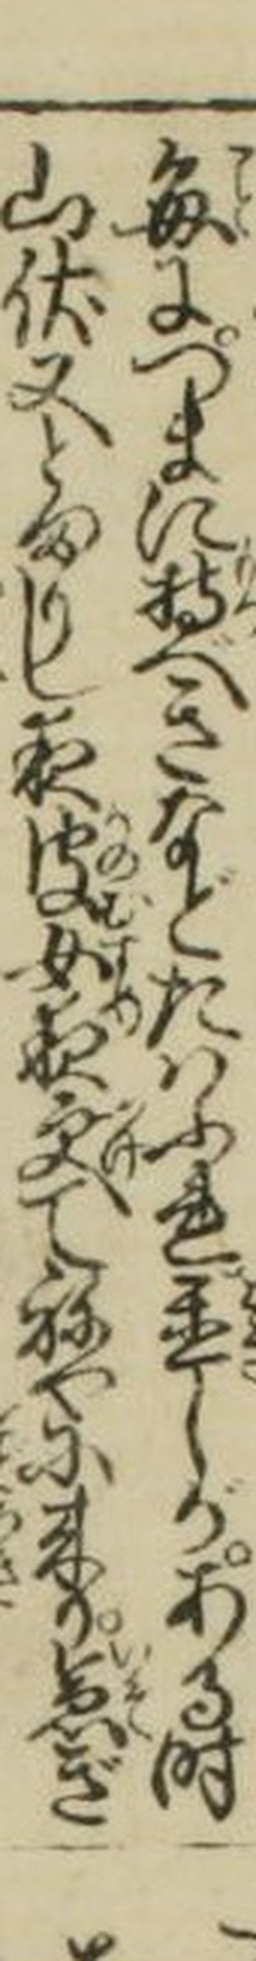山伏又とまりし夜彼女夜更てねやに来り。急ぎ
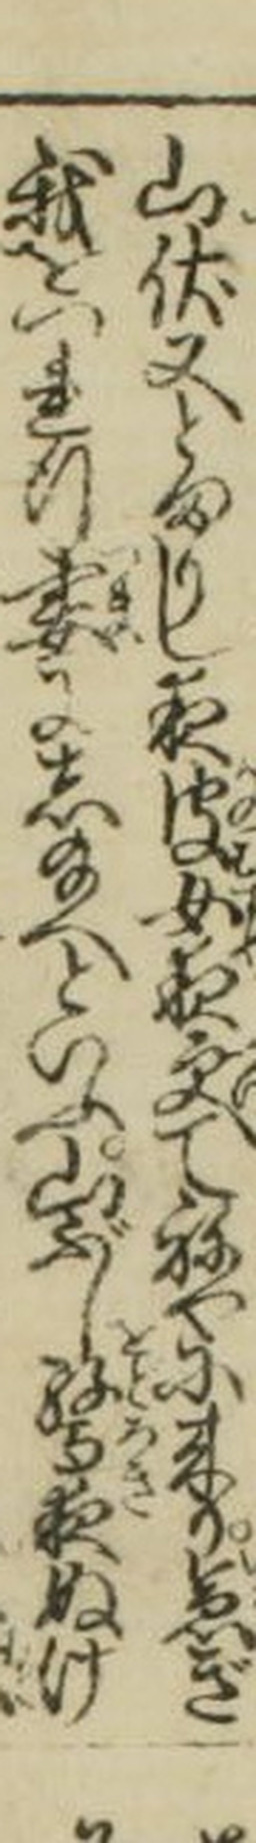我をつれ行妻にし給へといふ。山ぶし驚夜ぬけ
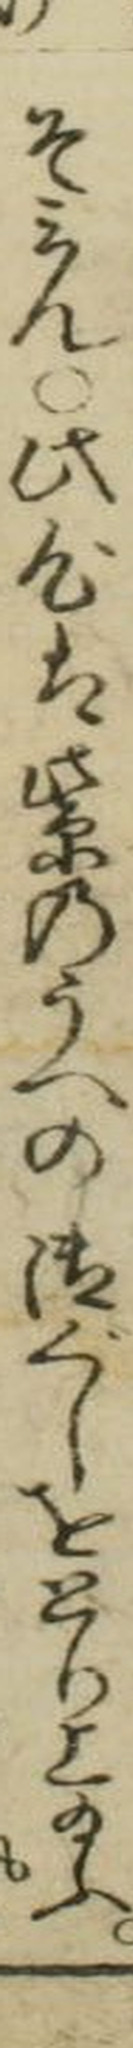そみん○此心は紫のうへの御ぐしをとり上給ふ。
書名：女源氏教訓鑑
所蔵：東京学芸大学附属図書館
